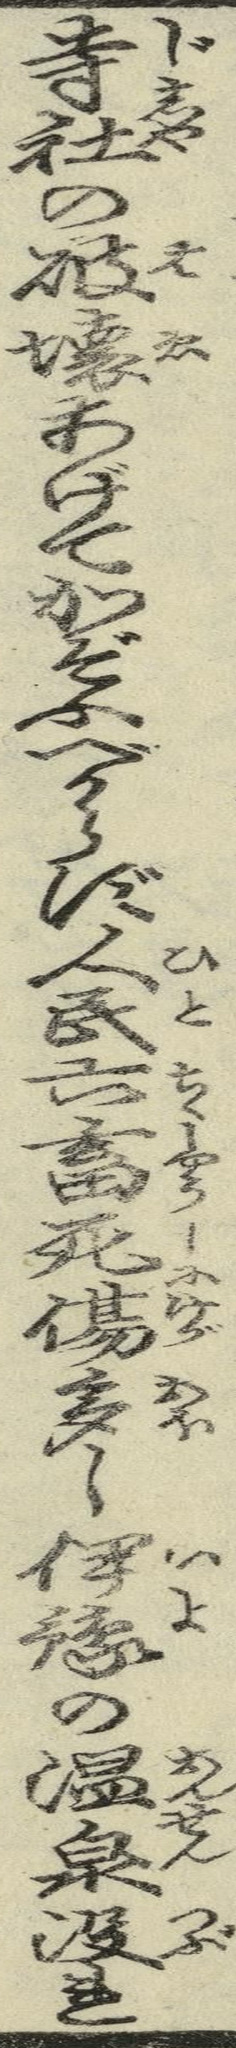寺社の破壊あげてかぞふべからず人民六畜死傷多し伊予の温泉没れ
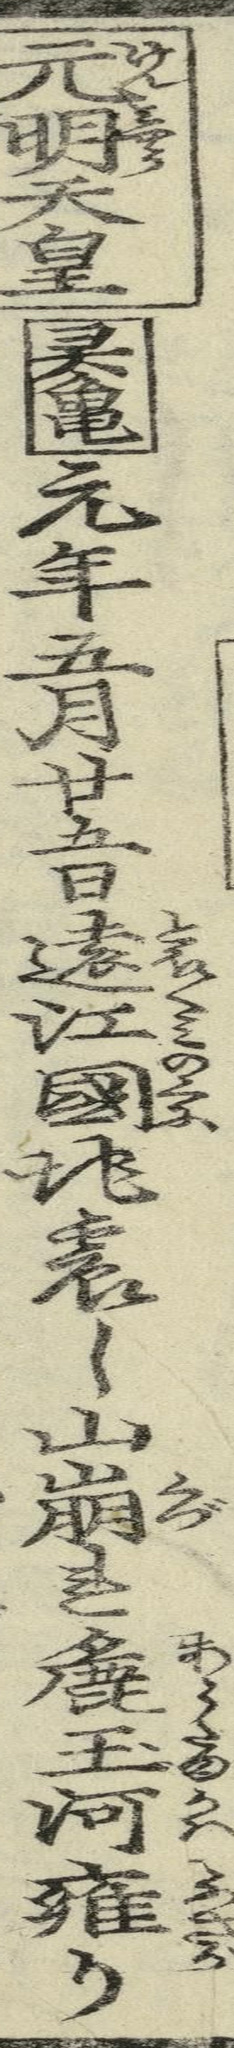元明天皇霊亀元年五月廿五日遠江国地震し山崩れ麁玉河雍り
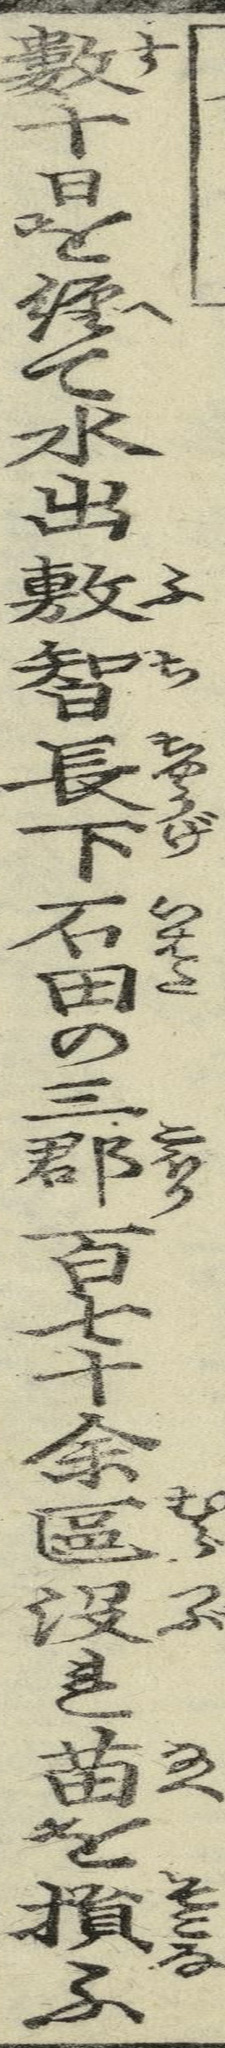数十日を経て水出敷智長下石田の三郡百七十余区没れ苗を損ふ
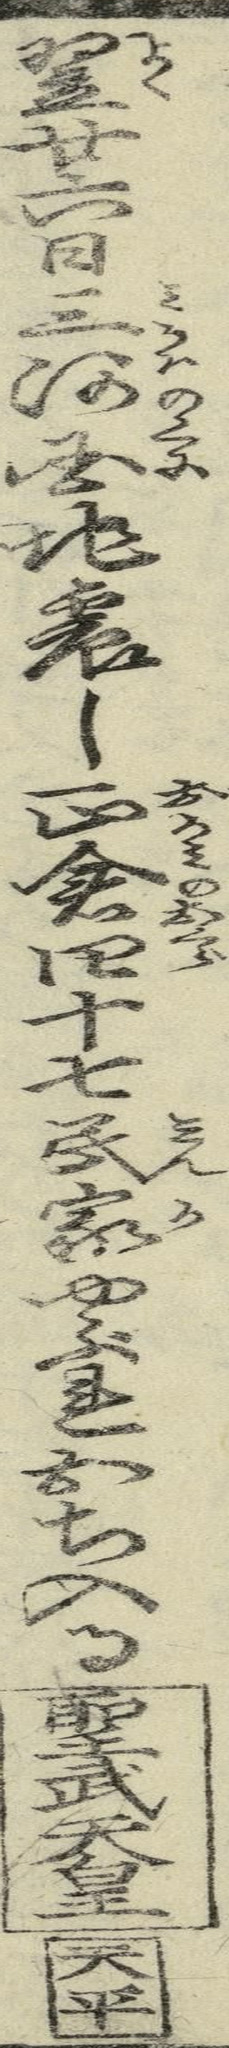翌廿六日三河国地震し正倉四十七民家やぶれおち入る聖武天皇天平
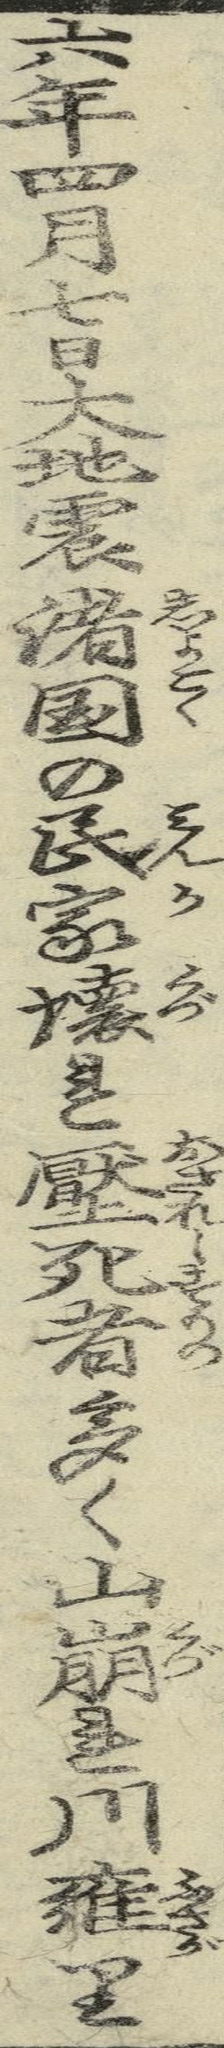六年四月七日大地震諸国の民家壊れ圧死者多く山崩れ川雍り
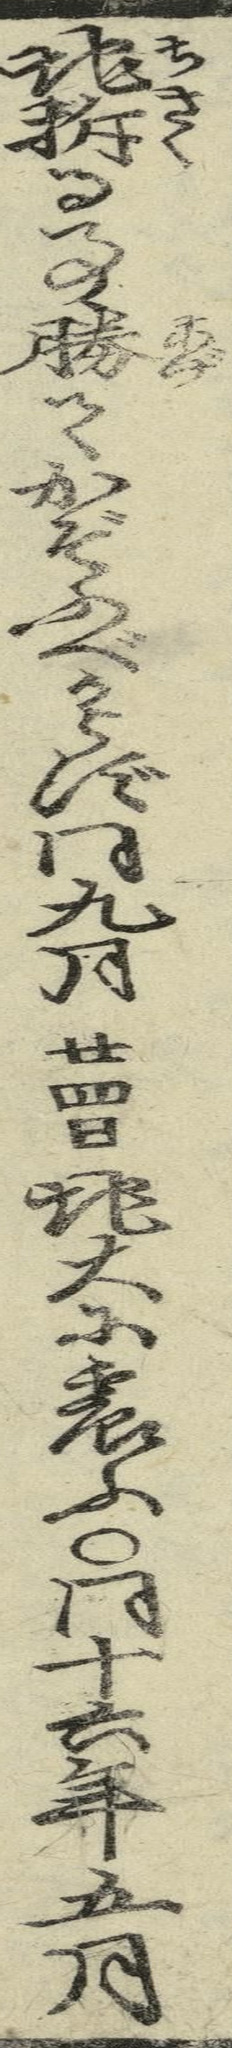地拆る事勝てかぞふべからず同九月廿四日地大に震ふ◯同十六年五月

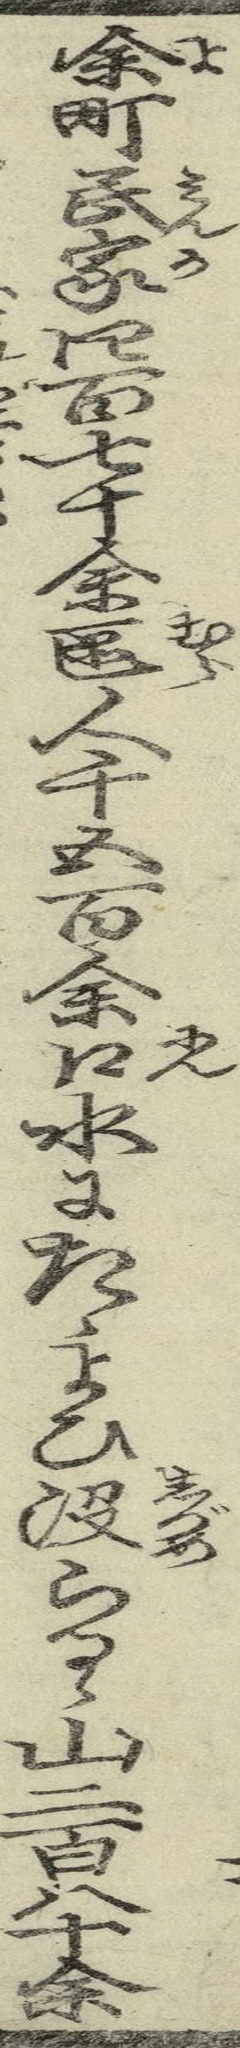余町民家四百七十余区人千五百余口水にたゝよひ没らるゝ山二百八十余
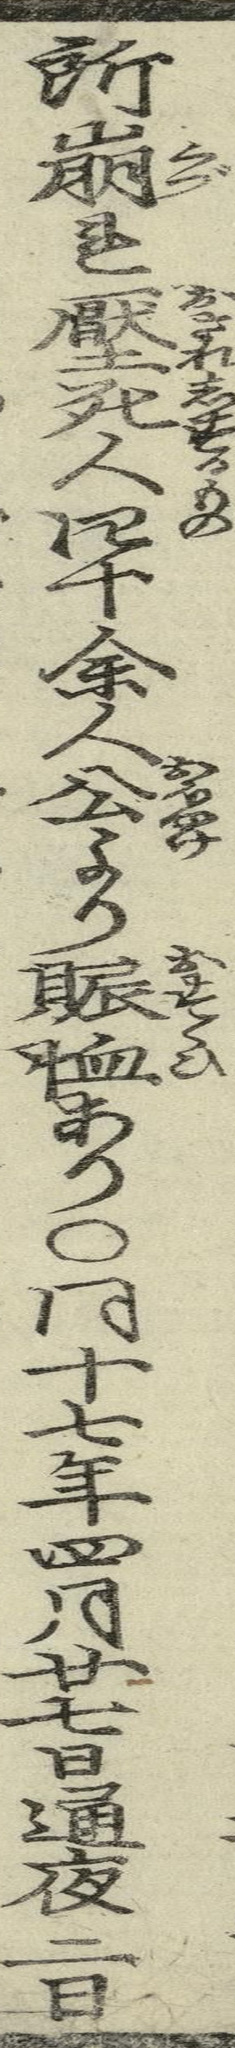所崩れ圧死人四十余人公より賑恤あり◯同十七年四月廿七日通夜二日
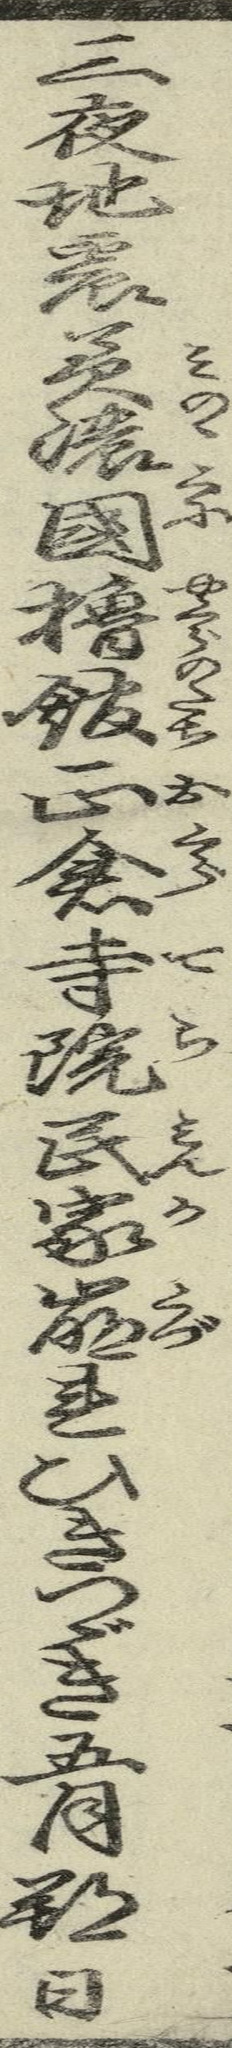三夜地震美濃国櫓館正倉寺院民家崩れひきつゞき五月朔日
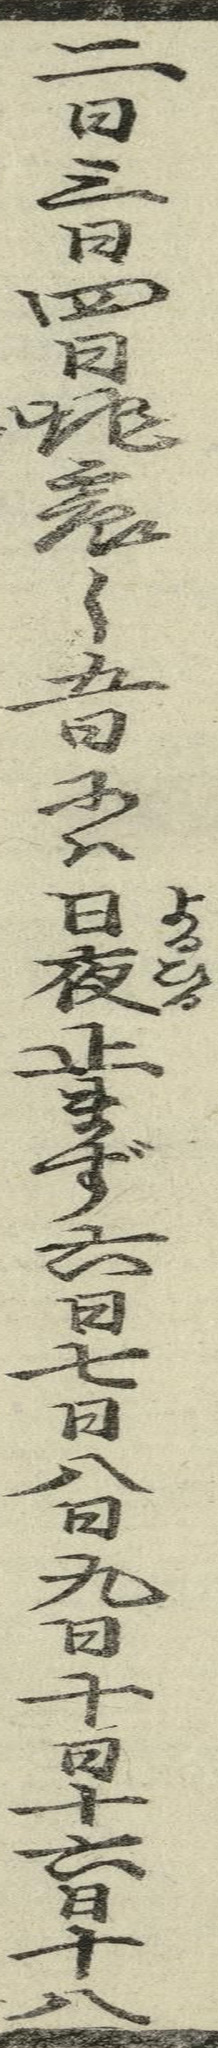二日三日四日地震し五日には日夜止まず六日七日八日九日十日十六日十八
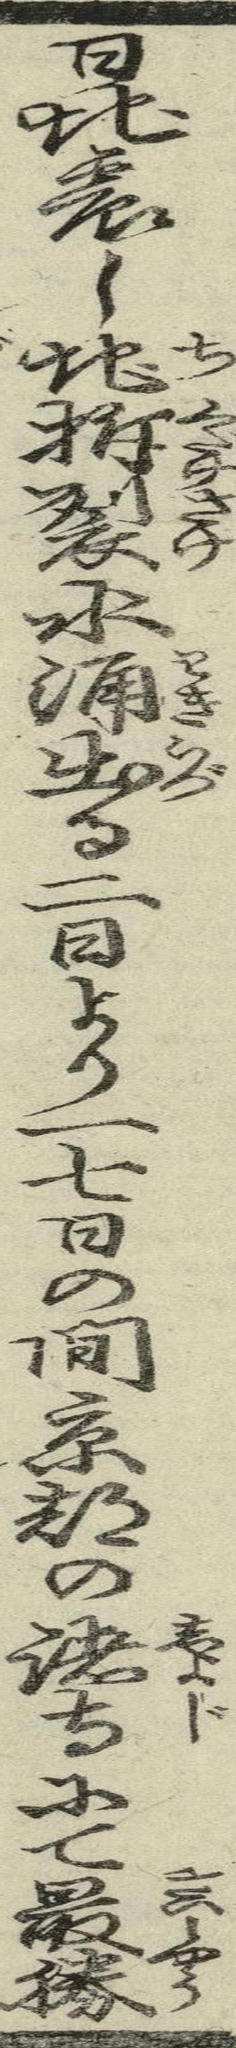日地震し地折裂水涌出る二日より一七日の間京都の諸寺にて最勝
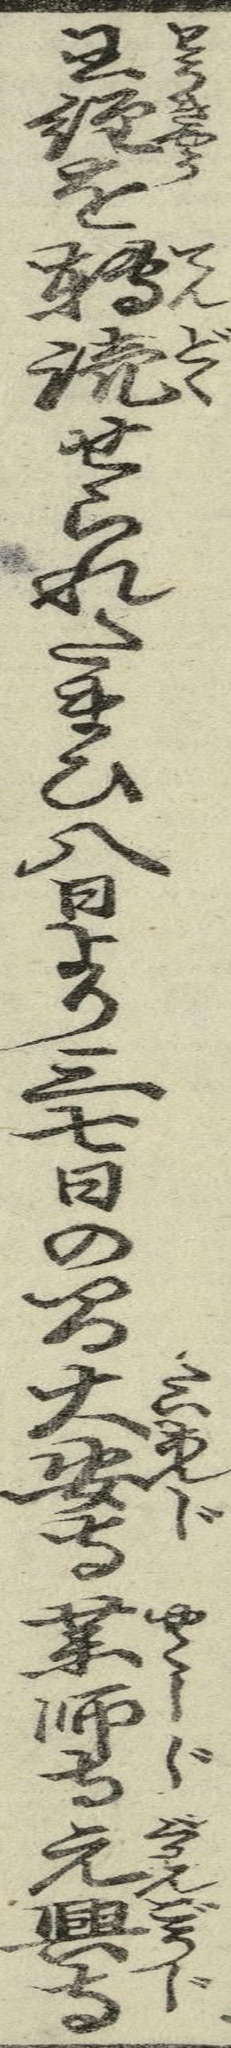王経を転読せられたまひ八日より三七日の間大安寺薬師寺元興寺
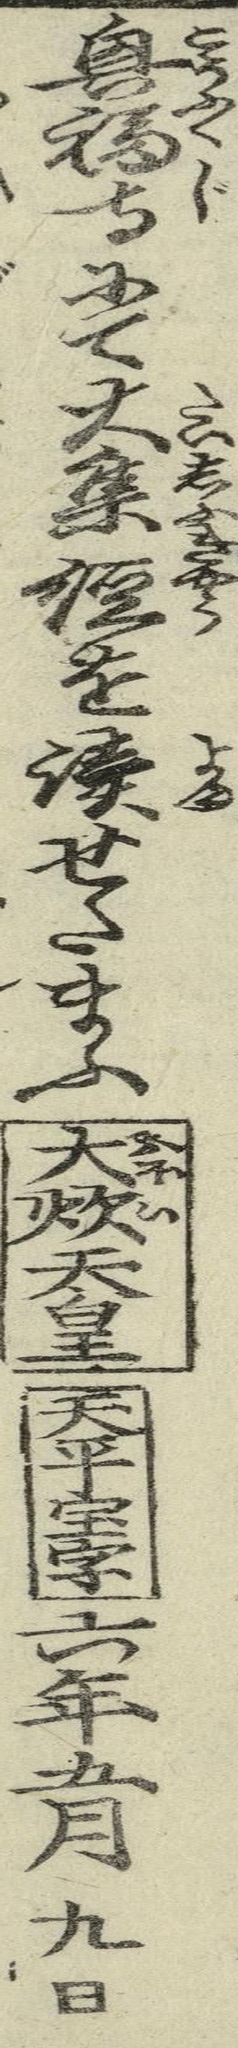興福寺にて大集経を読せたまふ大炊天皇天平宝字六年五月九日
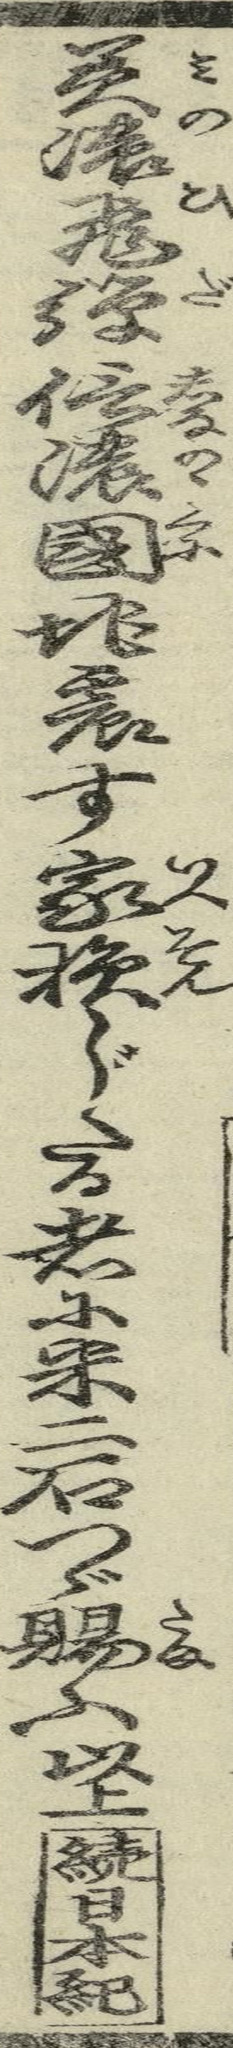美濃飛騨信濃国地震す家損じたる者に米二石つヾ賜ふ以上続日本紀
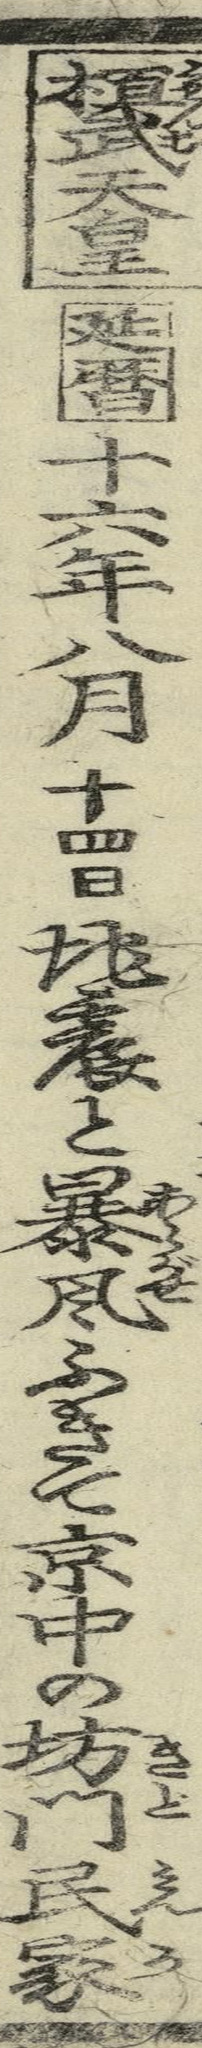桓武天皇延暦十六年八月十四日地震と暴風ふきて京中の坊門民家
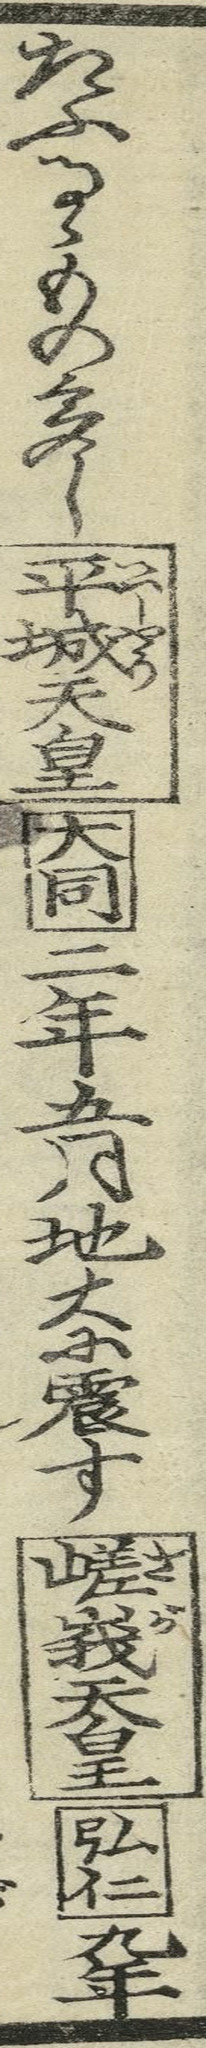たふるゝるもの多し平城天皇大同二年五月地大に震す嵯峨天皇弘仁九年
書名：地震年代記
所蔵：東京大学地震研究所図書室 Earthquake Research Institute Library, The University of Tokyo, JAPAN
